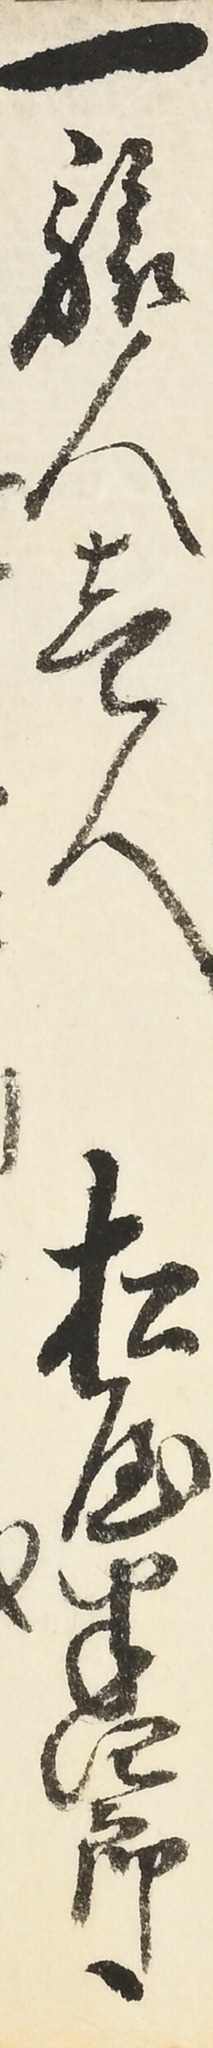一旅人壱人松屋半四郎・
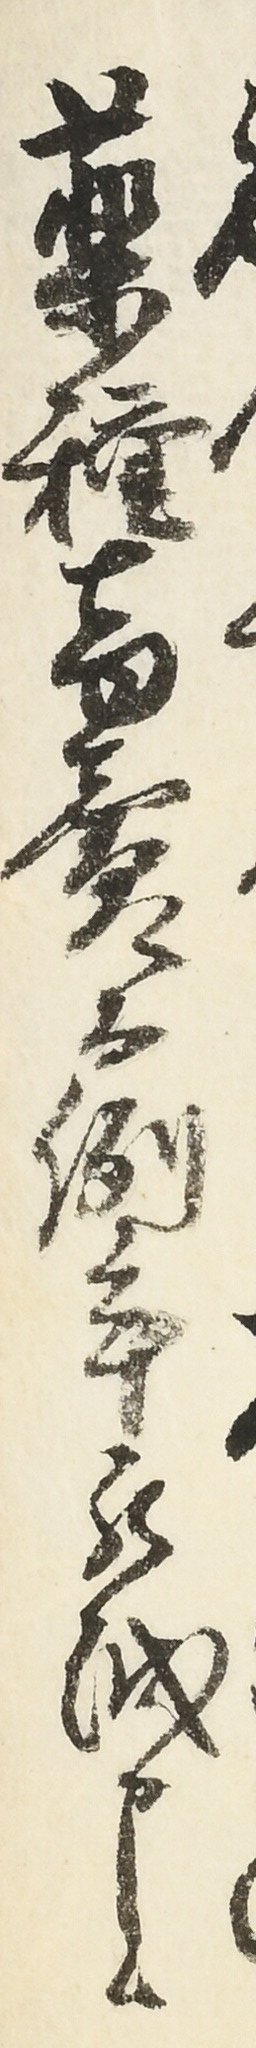薬種商売ニ而例年罷越申候

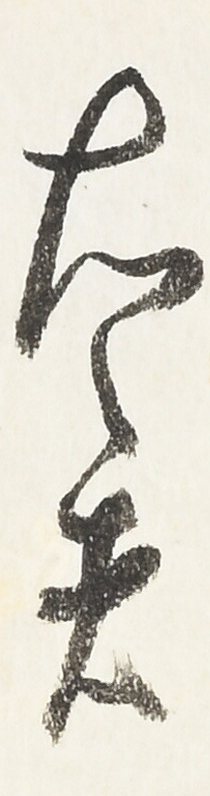右之者
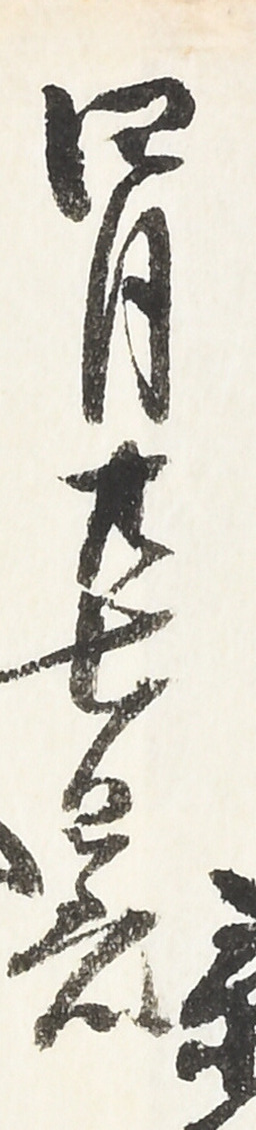四月廿七日着
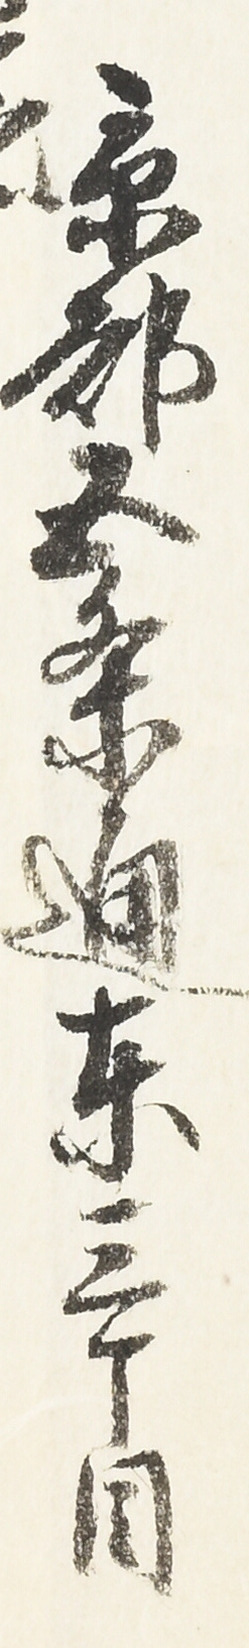京都五条通東三丁目
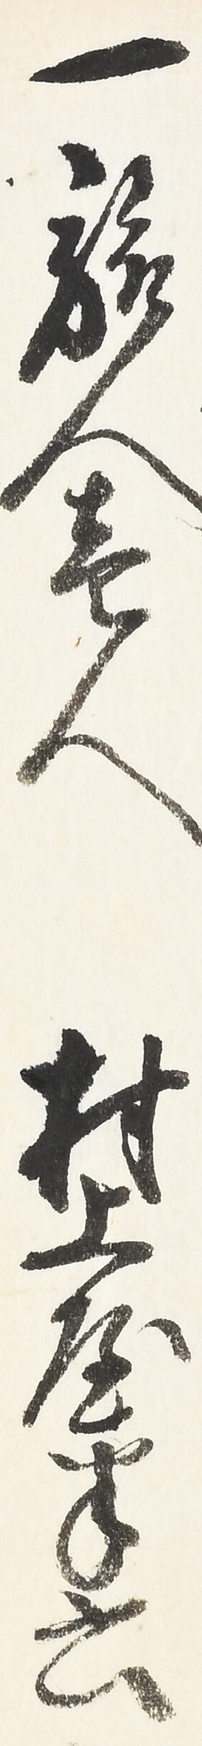一旅人壱人村上屋半六・
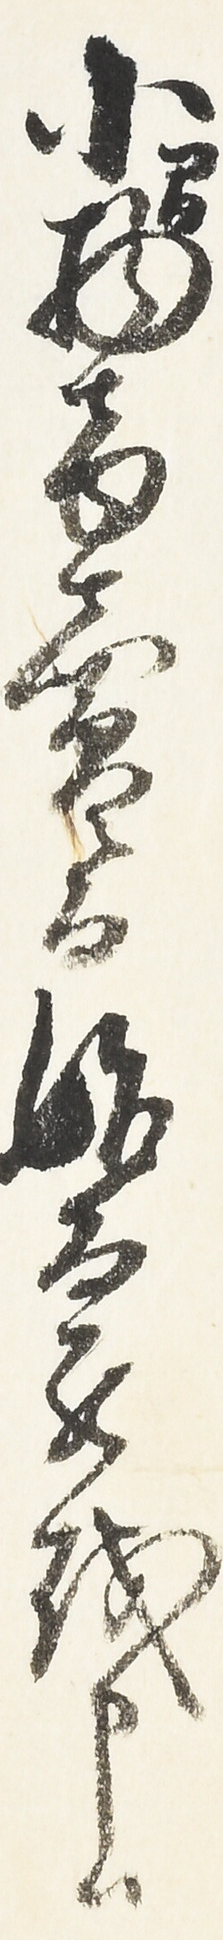小物商売ニ而始而罷越申候
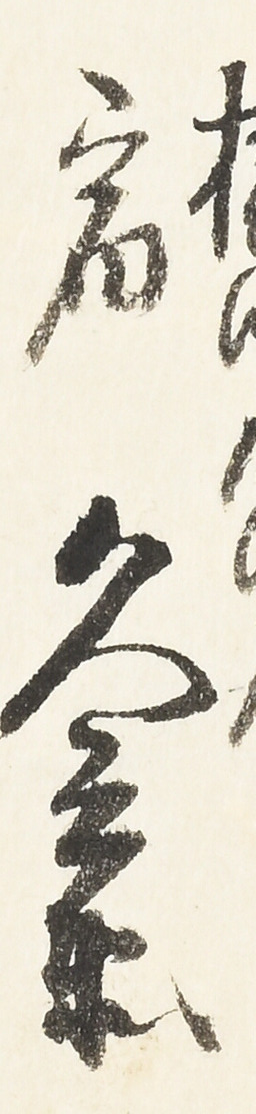宿久兵衛
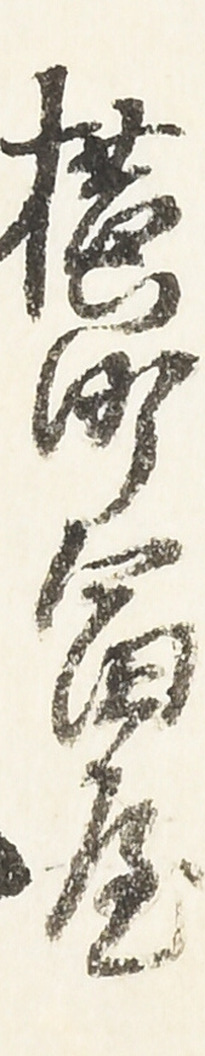横町冨屋
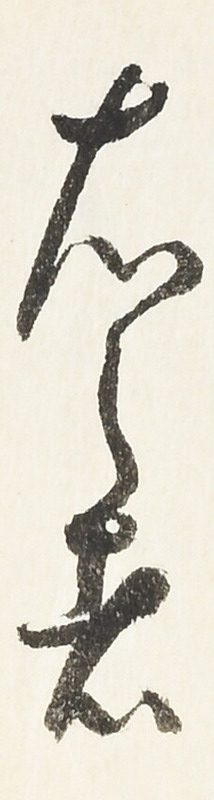右之者
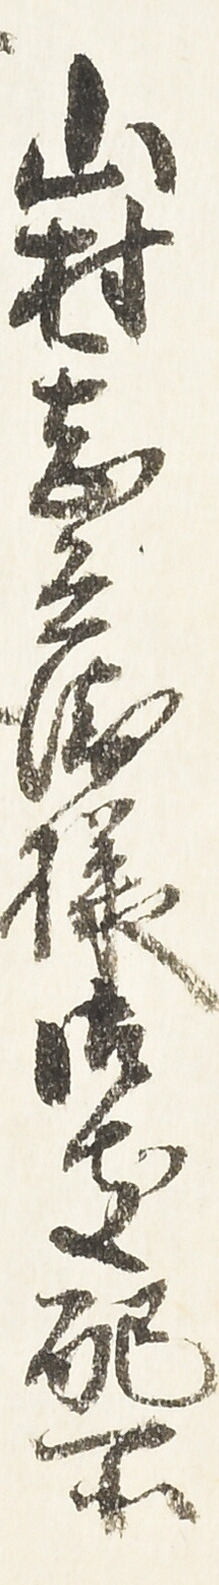山村甚兵衛様御支配所
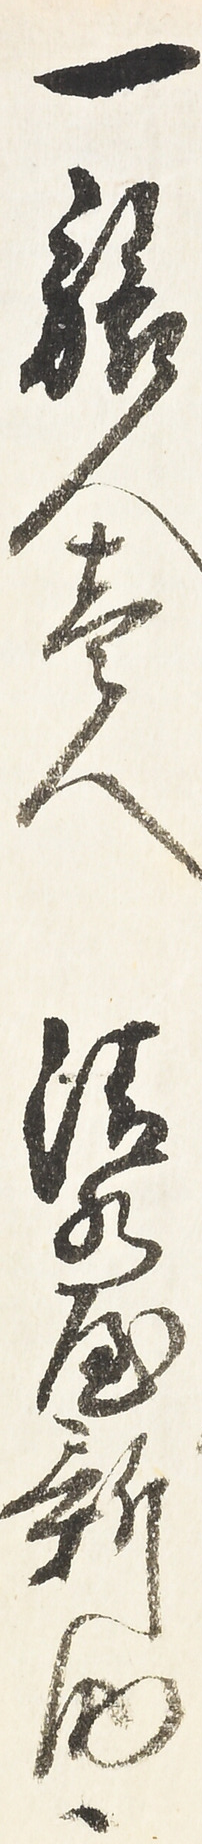一旅人壱人清水屋新助・
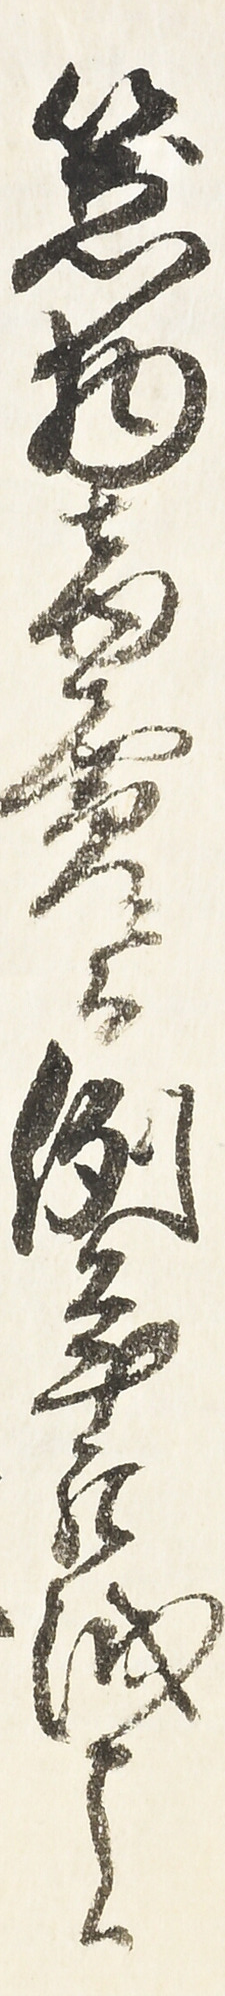器物商売ニ而例年罷越申候
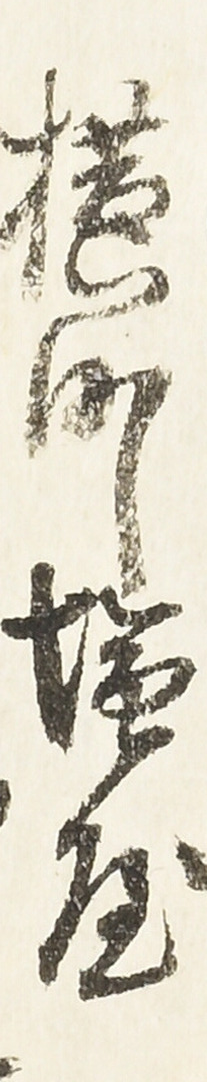横町塩屋
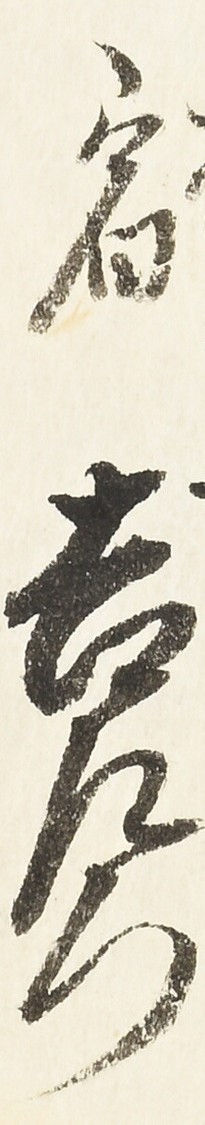宿吉左衛門
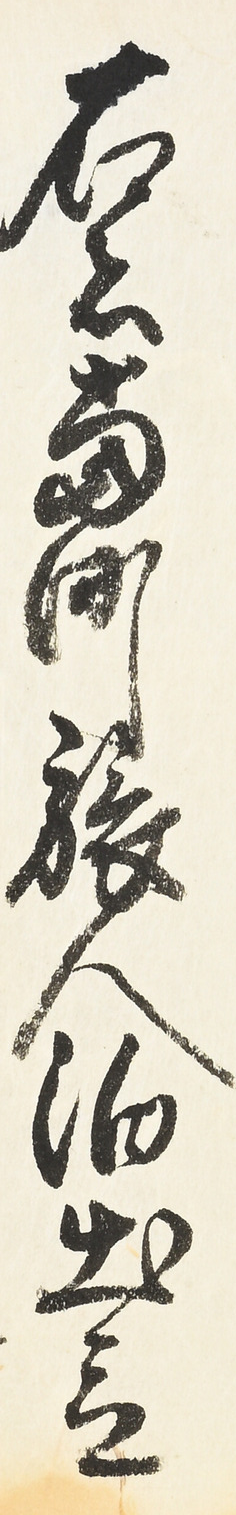右者当町旅人泊出立
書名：町中旅人泊控帳
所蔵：伊那市立高遠町図書館・合同会社AMANE
